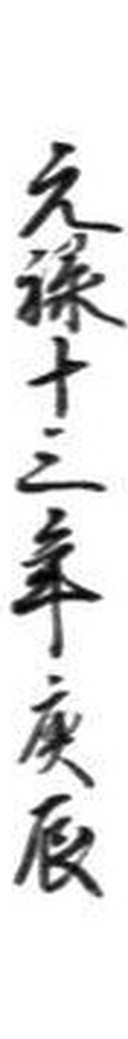元禄十三年庚辰
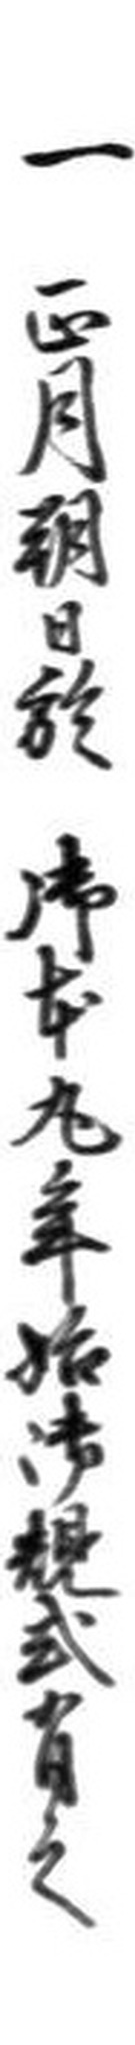一正月朔日於御本丸年始御規式有之
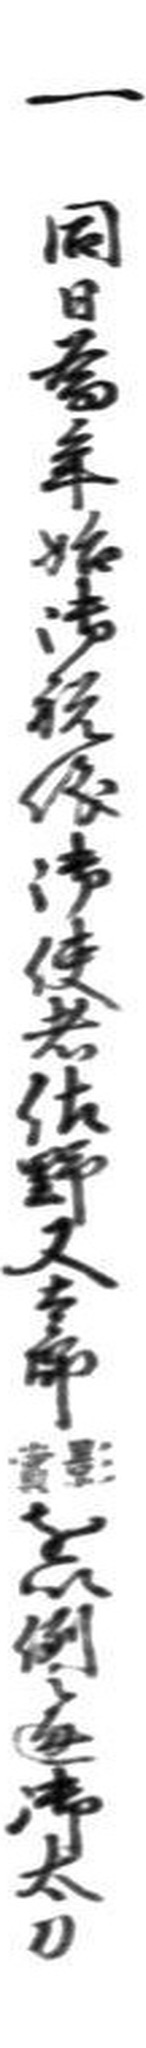一同日為年始御祝儀御使者佐野又太郎影賞を以例之通御太刀
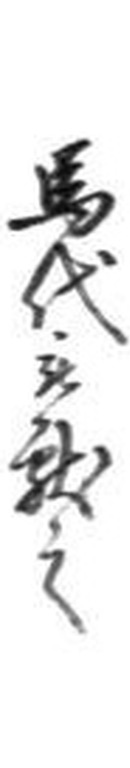馬代被献之
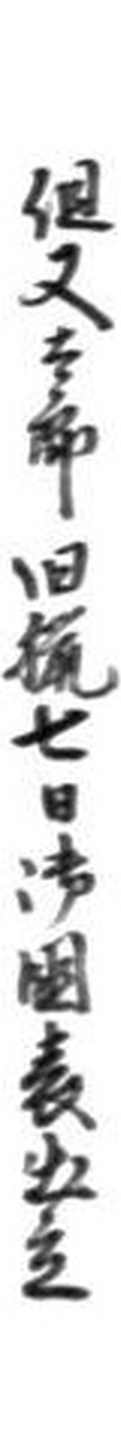但又太郎旧臘七日御国表出立
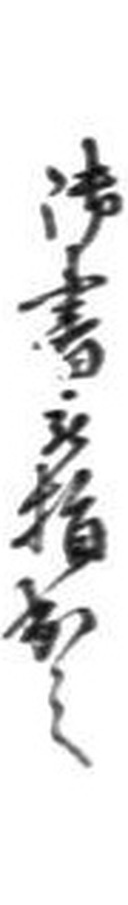御書被指出之

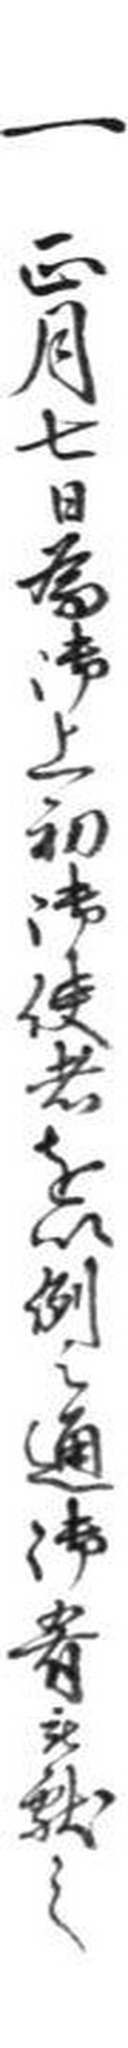一正月七日為御上初御使者を以例之通御肴被献之
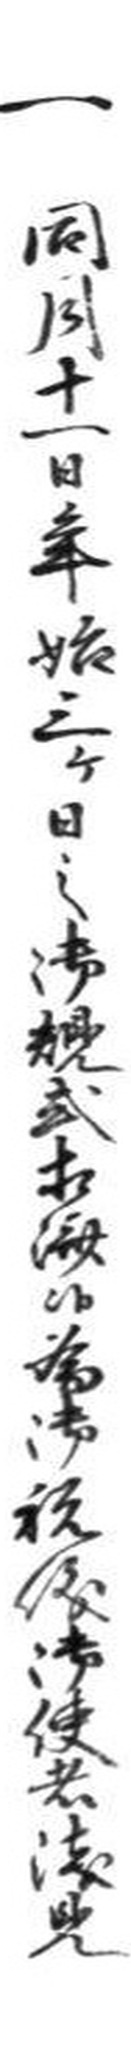一同月十一日年始三ヶ日之御規式相済候為御祝儀御使者浅見
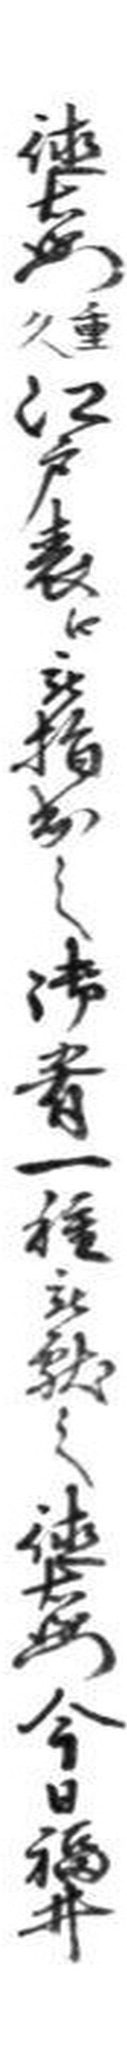徳右衛門重久江戸表江被指出之御肴一種被献之徳右衛門今日福井
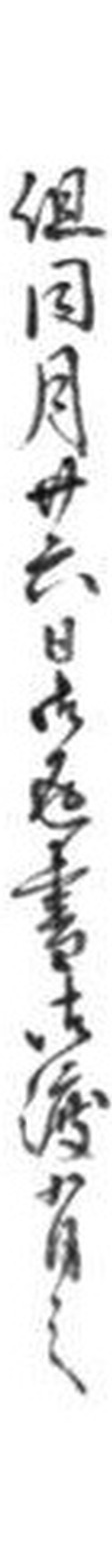但同月廿六日御返書御渡有之
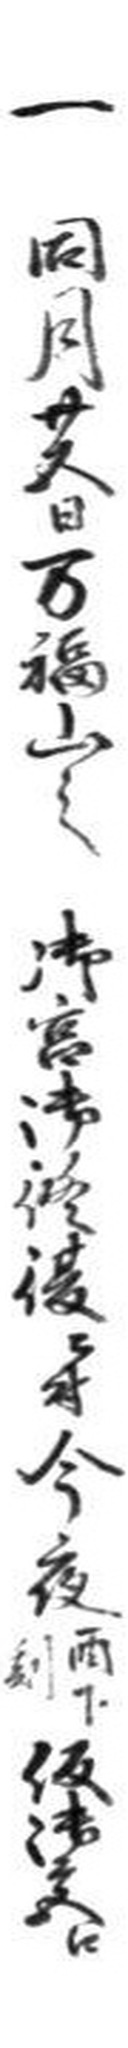一同月廿五日万福山之御宮御修復ニ付今夜酉下刻仮御宮江
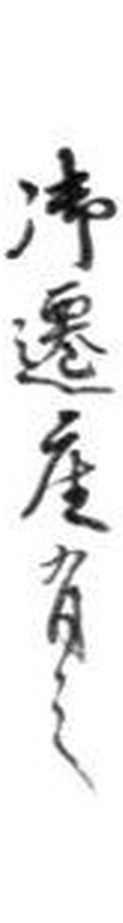御遷座有之
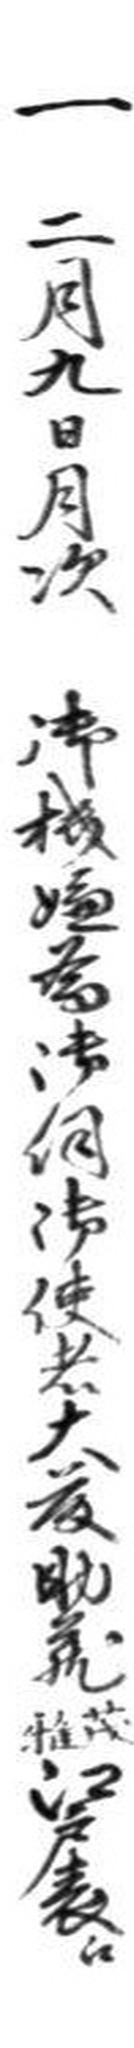一二月九日月次御機嫌為御伺御使者大藤助蔵茂雅江戸表江
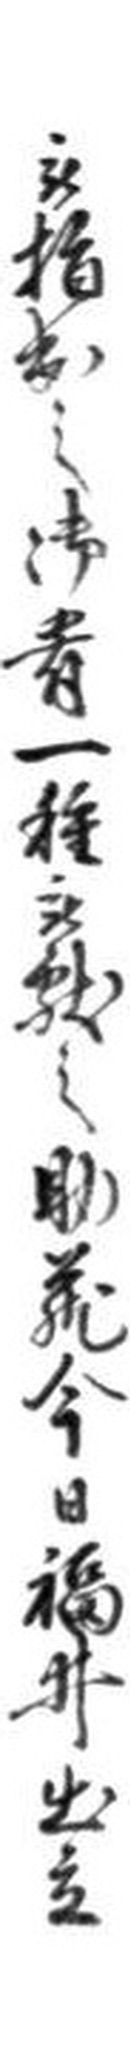被指出之御肴一種被献之助蔵今日福井出立
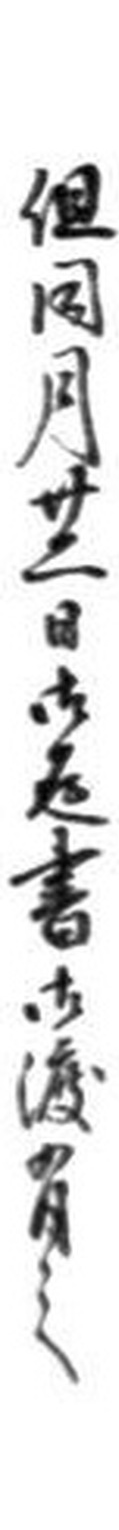但同月廿二日御返書御渡有之
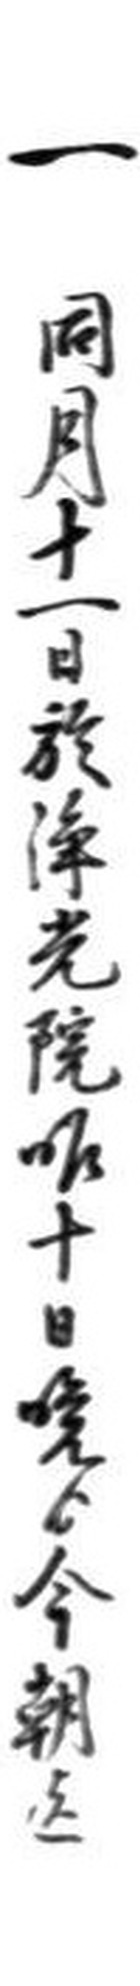一同月十一日於浄光院昨十日暁ゟ今朝迄
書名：家譜 二十一 吉品公 従元禄十三年到同十四年
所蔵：福井県文書館 Fukui Prefectural Archives
